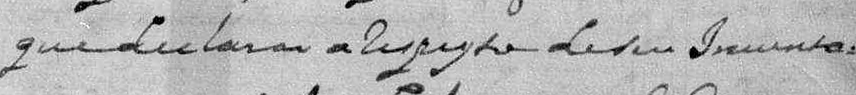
que declarar a Respeyto de seu Inuenta
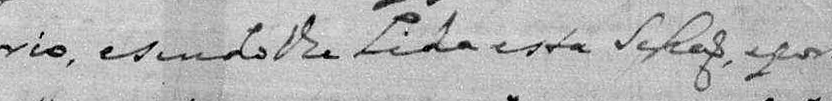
rio, e sendolhe Lida esta sessaõ, e por
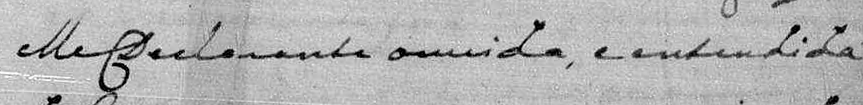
elle Declarante ouuida, e entendida
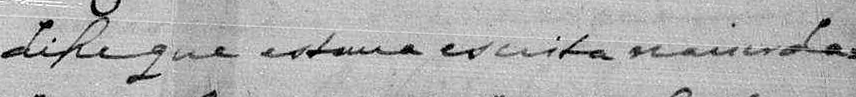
disse que estaua escrita na uerda
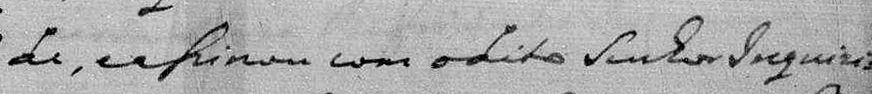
de, e assinou com o dito Senhor Inquizi
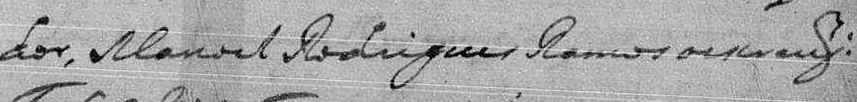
dor, Manoel Rodrigues Ramos o escreuj.
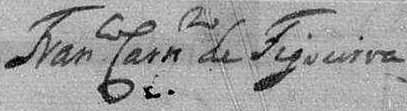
Franco Carnro de Figueira
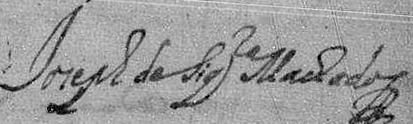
Iozeph de Siq.ra Machado
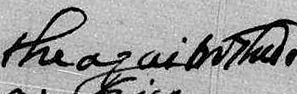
the aqui treslado
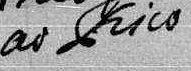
ao Fisco
